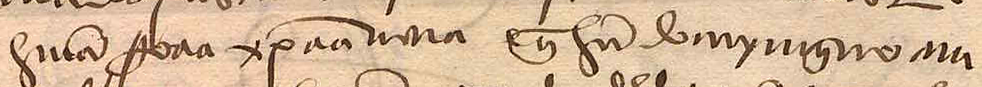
huuā foaa xpāa noua e q̄ hū domymguo am
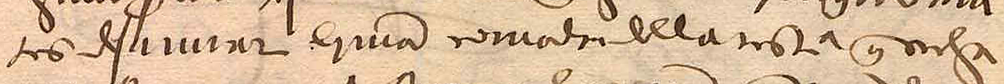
tes do Jamtar huuā comadre della testa q̄ se cha
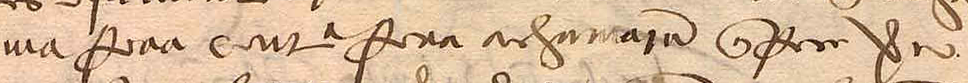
ma foaa e outa foaa a chamarā q̄ fose ꝟ co
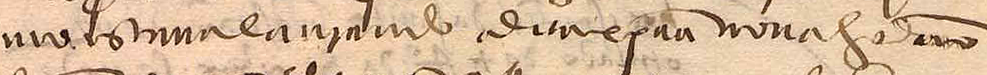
mo estaua laurando a dita xpaā noua ho dito
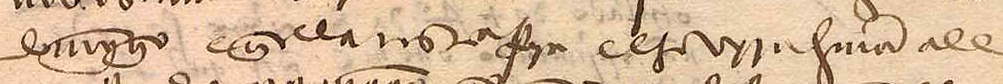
domȳgo e q̄ ella testa fora e lhe vyra huuā all
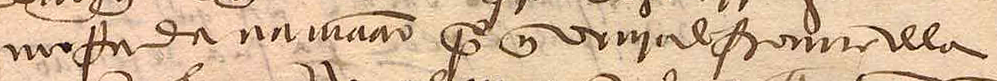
mofada na maão p̄oq̄ vyuja defromte dela
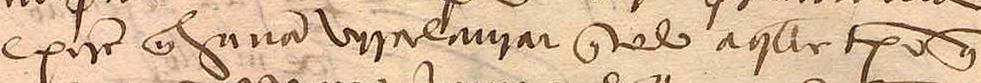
e porē q̄ ha nā vyra laurar q̄ todo aq̄lle tp̄o q̄
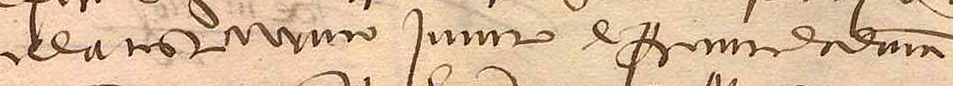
ella testa vyueo Jumto defromte da dita
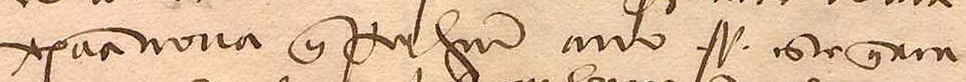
xpāa noua q̄ foy huū ano .ss. este q̄ aca
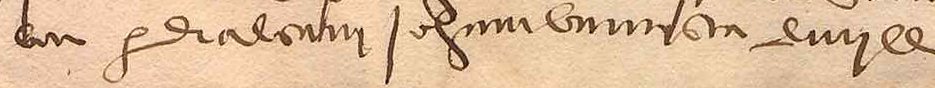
bou ꝑ dia de sam Joham bautysta de mjll
